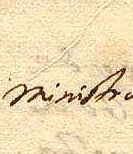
ministro
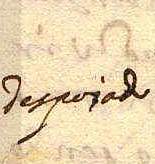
despojado
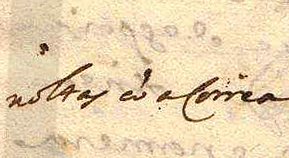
uoltas cō a Correa
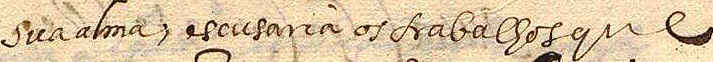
sua alma, escusaria os trabalhos que
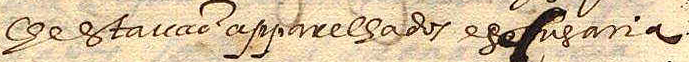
lhe estauão apparelhados e se_usaria
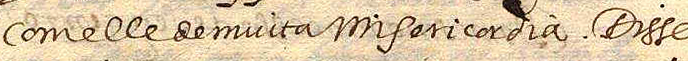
com elle de muita misericordia. Disse
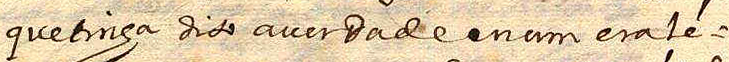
que tinha dito a uerdade e nam era lē
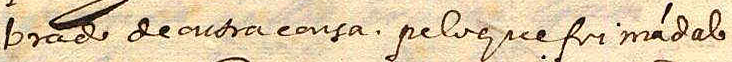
brado de outra cousa. pelo que foi mādado
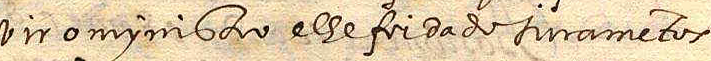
vir o mynistro e lhe foi dado iuramētos
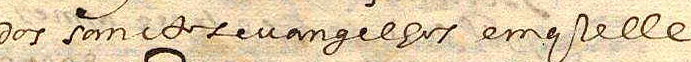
dos sanctos euangelhos em q̄ elle
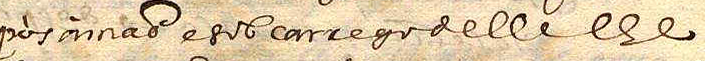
pōs a maõ e sob carrego delle lhe
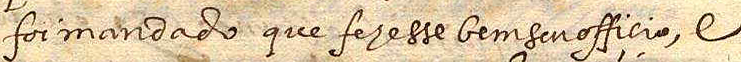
foi mandado que fezesse bem seu officio, e
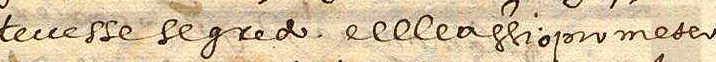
teuesse segredo e elle as̄si o prometeo
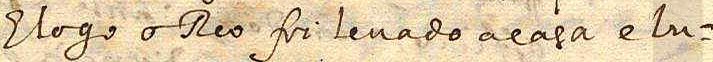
E Logo o Reo foi Leuado a casa e Lu
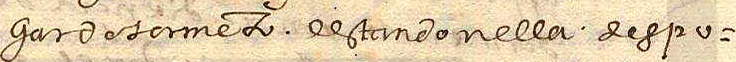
gar de tormēto. e estando nella despo
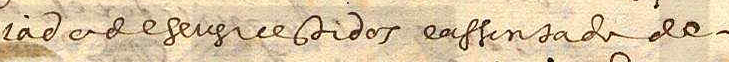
iado de seus uestidos e assentado de
